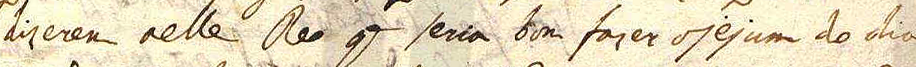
dizerem a elle Reo q̄ seria bom fazer o jejum do dia
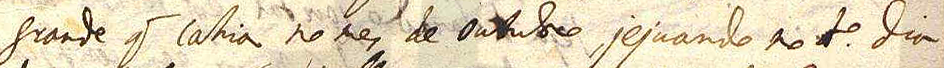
grande q̄ cahia no mes de outubro, jejuando no d̄o. dia
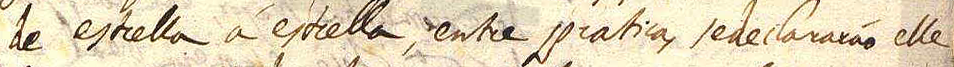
de estrella a estrella, entre praticas se declararaõ elle
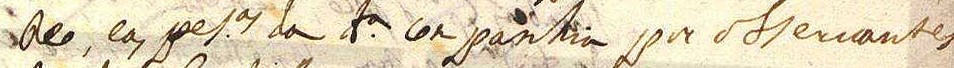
Reo, e as pes.as da d̄a. companhia por obseruantes
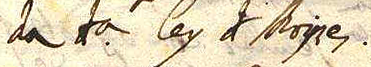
da d̄a. ley d̄ Moyzes.
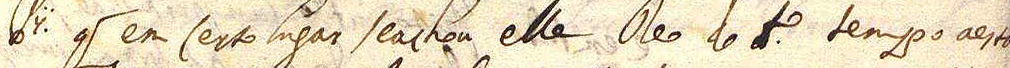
Pr. q̄ em Certo lugar se achou elle Reo do d̄.o tempo a esta
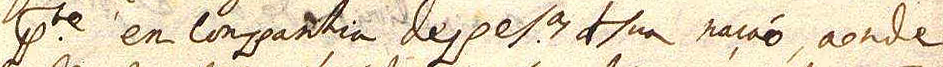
p.te em companhia de pes.as d̄ sua naçaõ, aonde
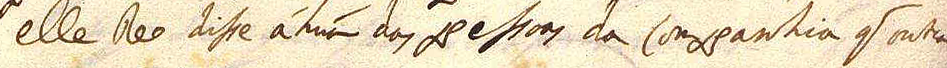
elle Reo disse á huā das pessoas da Companhia q̄ outra
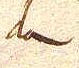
da
